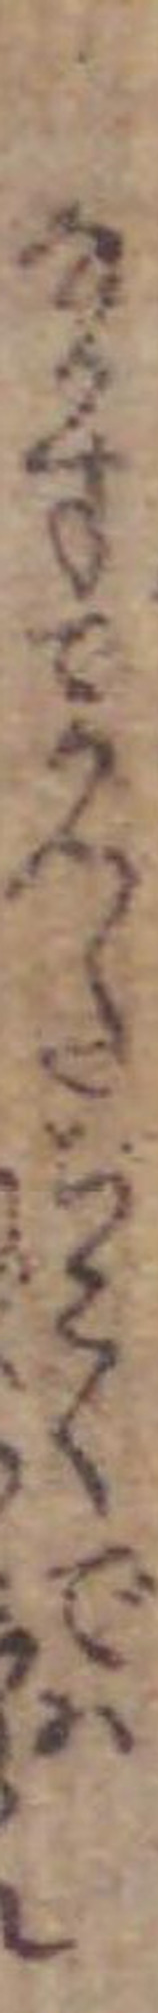なかすてかつたぢこくでは
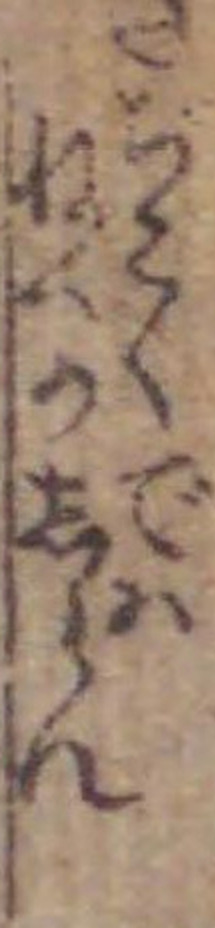ねへかしらん

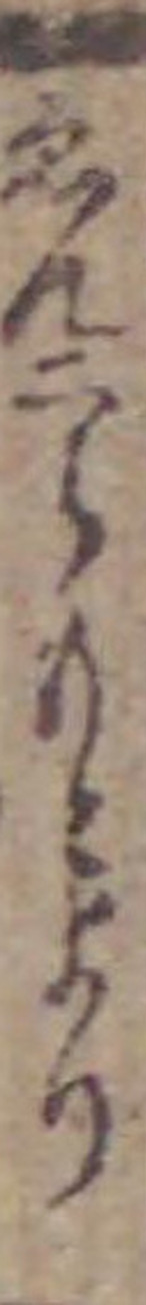ゑん二郎もとより
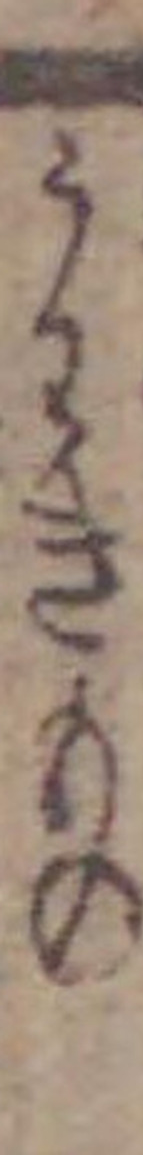うわきもの
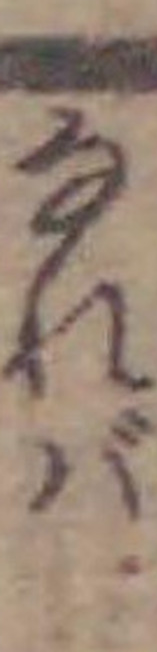なれば
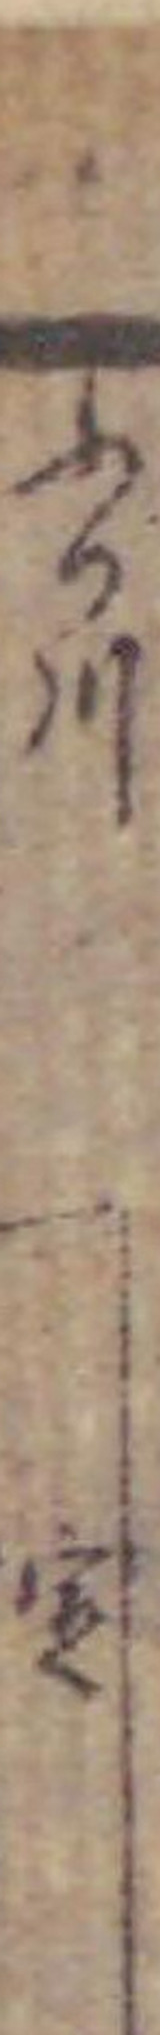ふか川
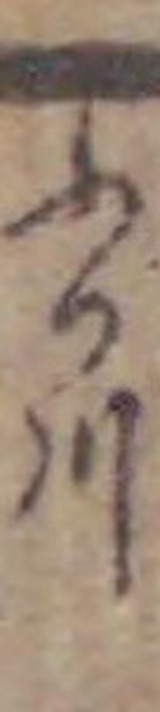ふか川
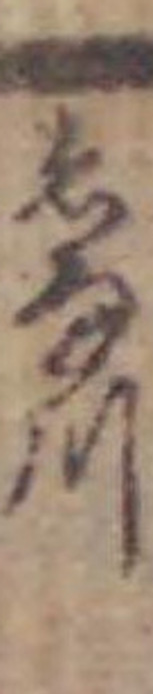しな川
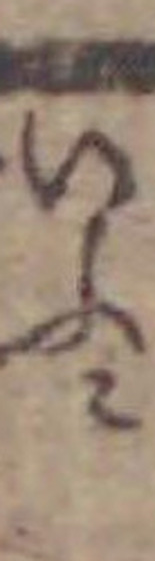いふに
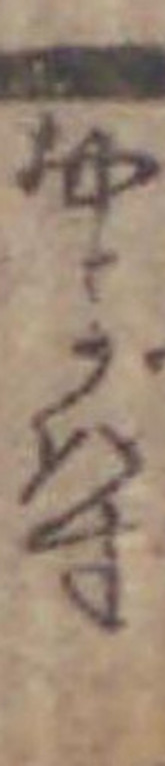およはす
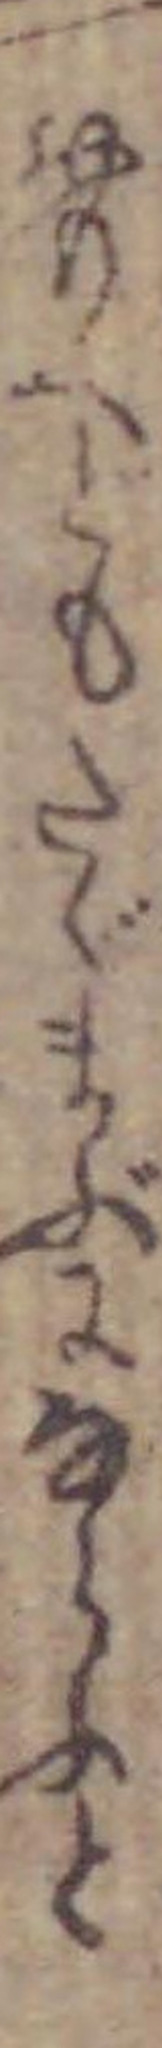おもへどもたゞまぶにならふと
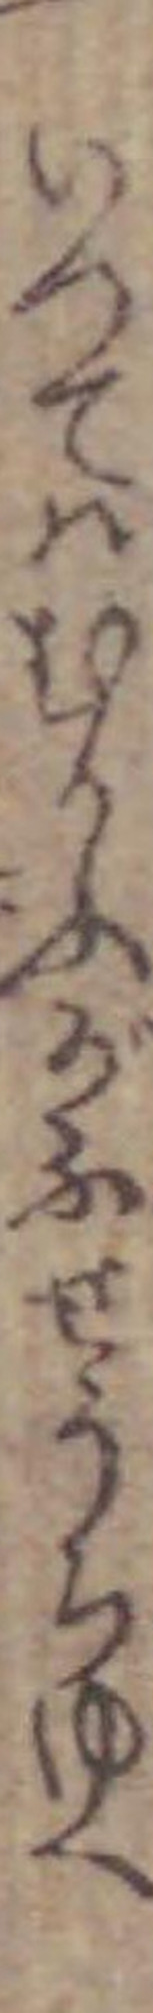いつてはむかふがふせうちゆへ
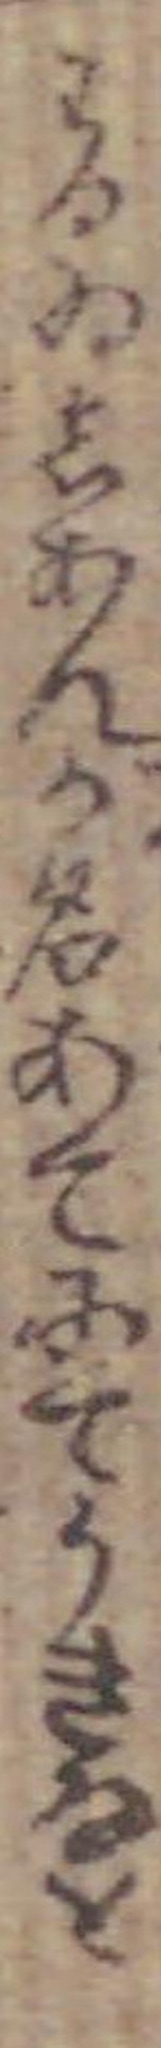わるゐしあんが名あてにてうきなを
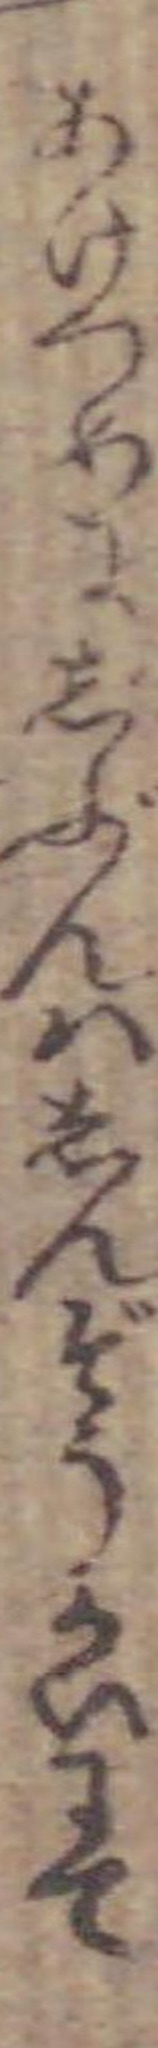あけつめにじぶんはしんぞうかいにて
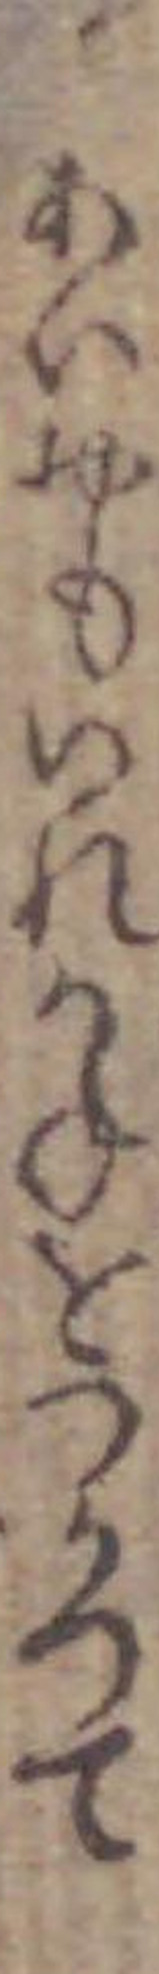あいおもいれかねをつかつて
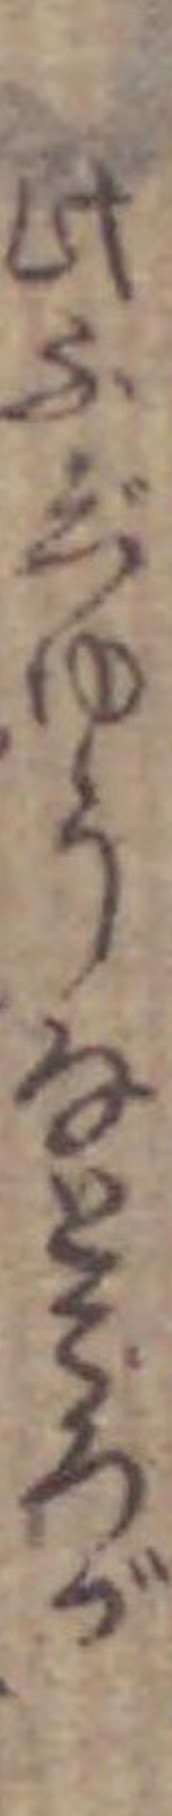此ふじゆうなところが
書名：江戸生艶気樺焼 : 3巻
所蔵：国立国会図書館 National Diet Library, JAPAN
